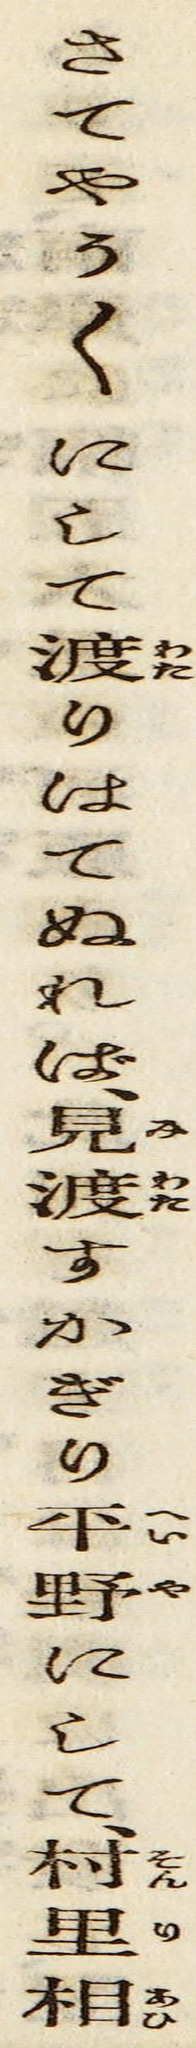さてやう〳〵にして渡りはてぬれば、見渡すかぎり平野にして、村里相
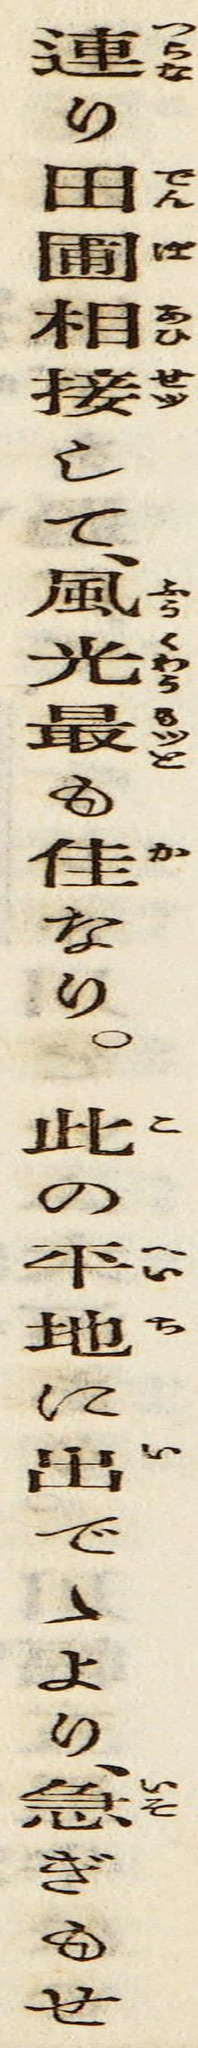連り田圃相接して、風光最も佳なり。此の平地に出でゝより、急ぎもせ
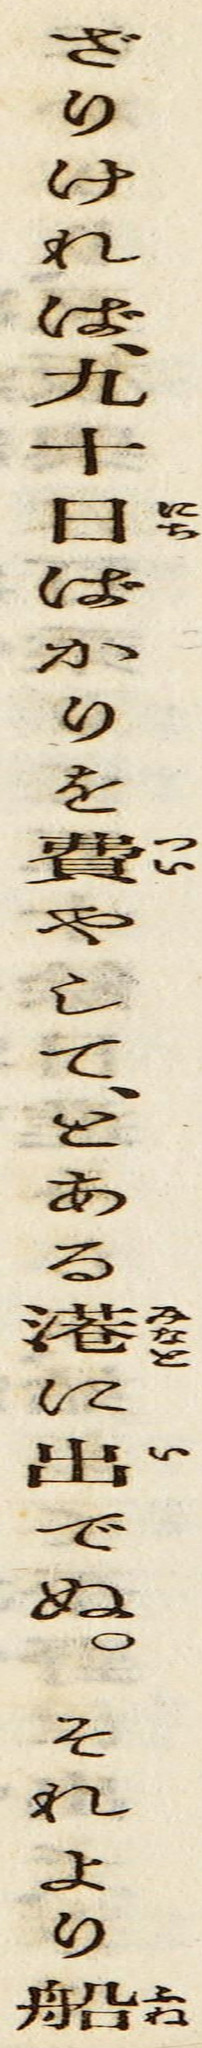ざりければ、九十日ばかりを費やして、とある港に出でぬ。それより船
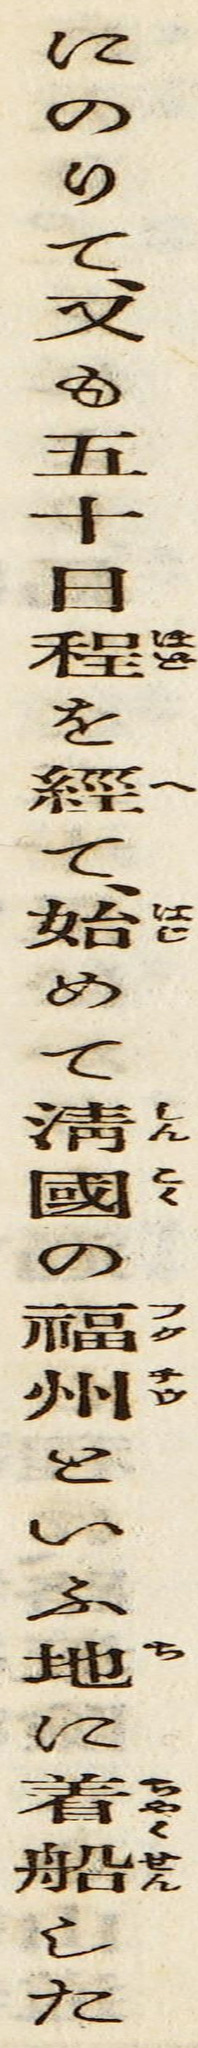にのりて、又も五十日程を経て、始めて清国の福州といふ地に着船した
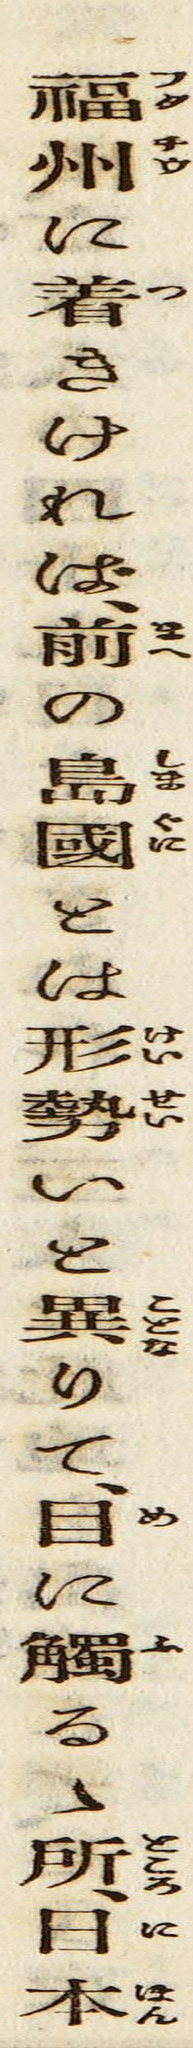福州に着きければ、前の島国とは形勢いと異りて、目に触るゝ所、日本
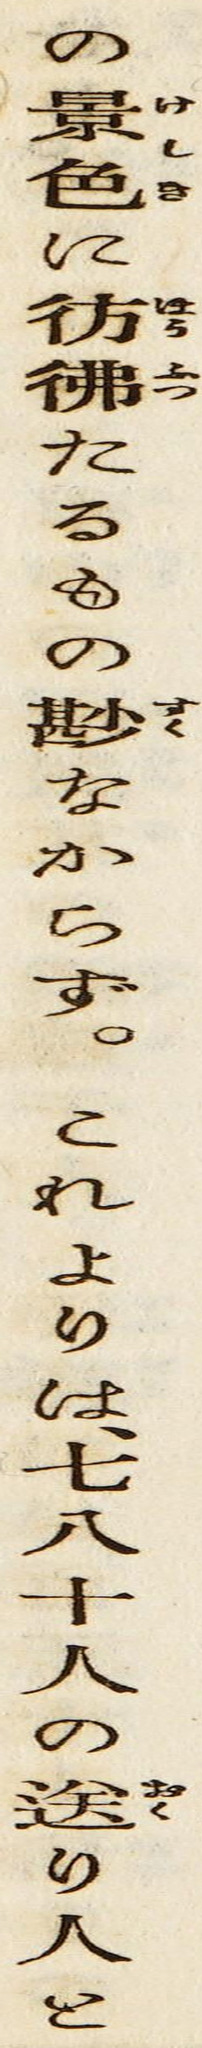の景色に彷彿たるもの尠なからず。これよりは、七八十人の送り人と
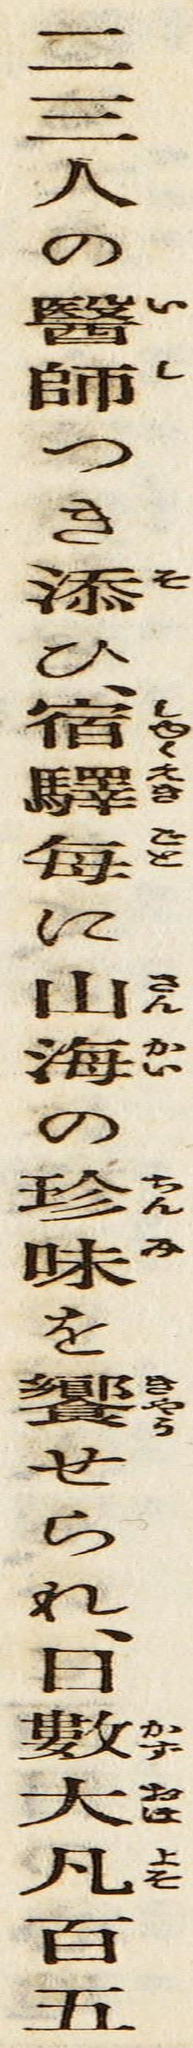二三人の医師つき添ひ、宿駅毎に山海の珍味を饗せられ、日数大凡百五
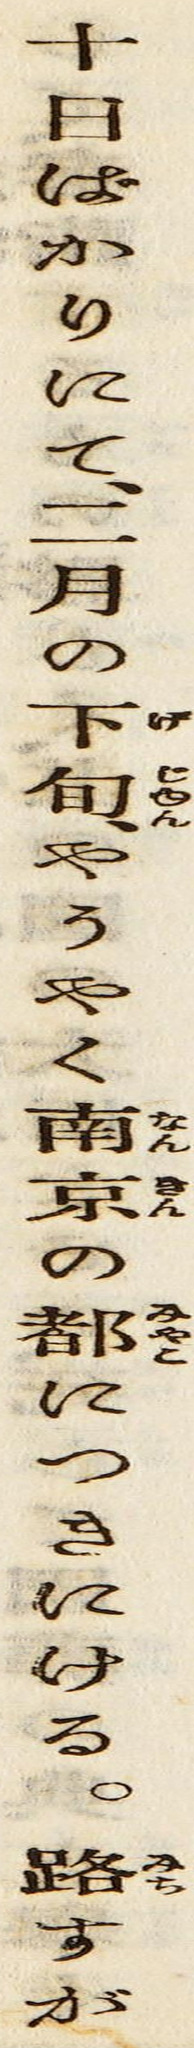十日ばかりにて、二月の下旬、やうやく南京の都につきにける。路すが
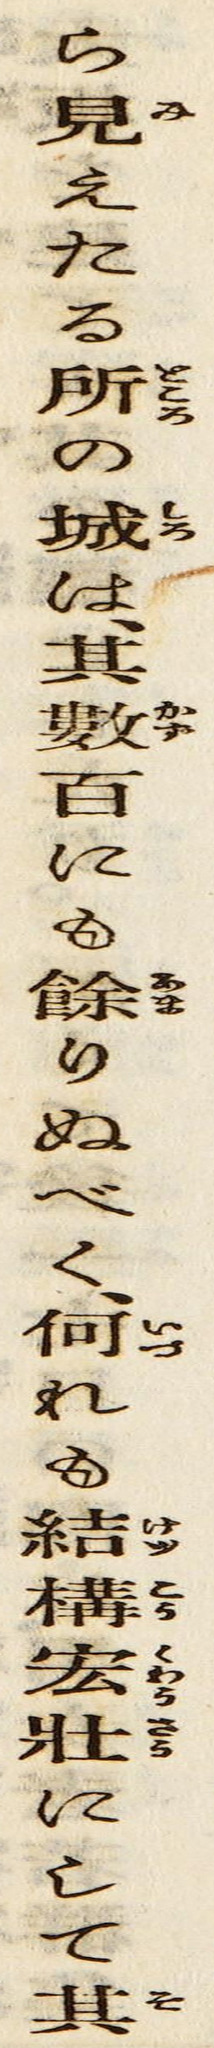ら見えたる所の城は、其数百にも余りぬべく、何れも結構宏壮にして其
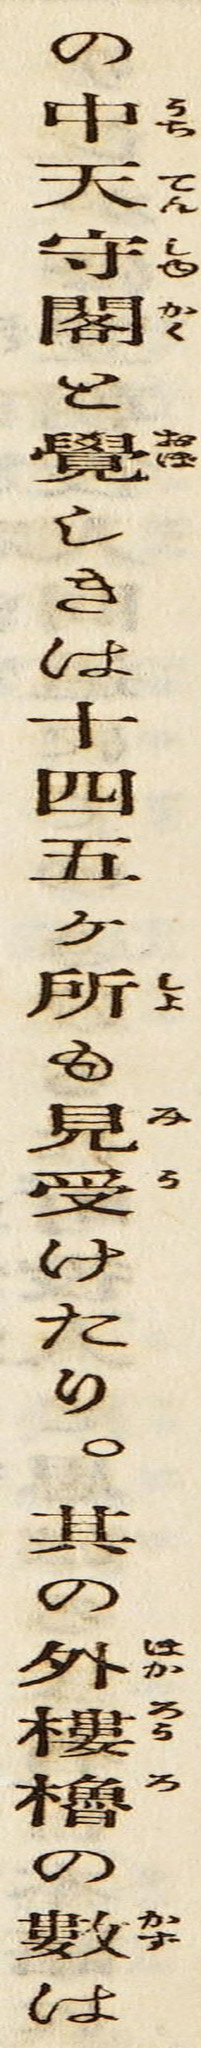の中天守閣と覚しきは十四五ケ所も見受けたり。其の外楼櫓の数は
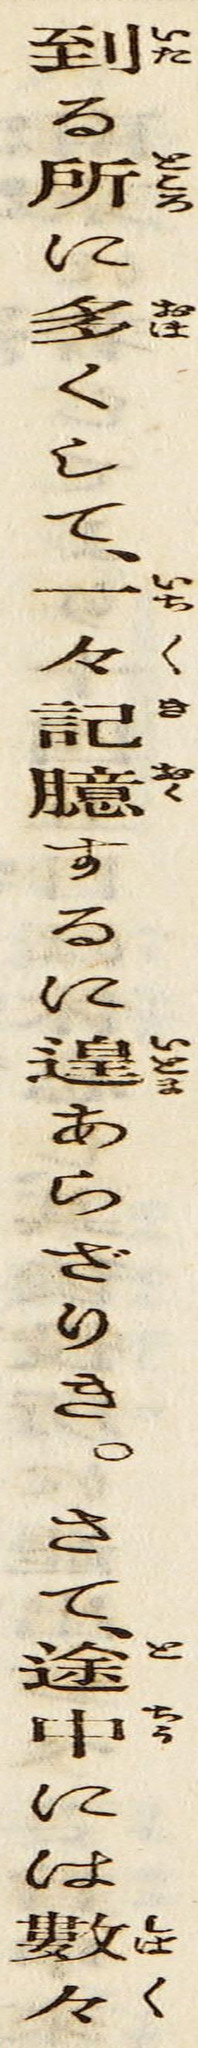到る所に多くして、一々記臆するに遑あらざりき。さて、途中には数々
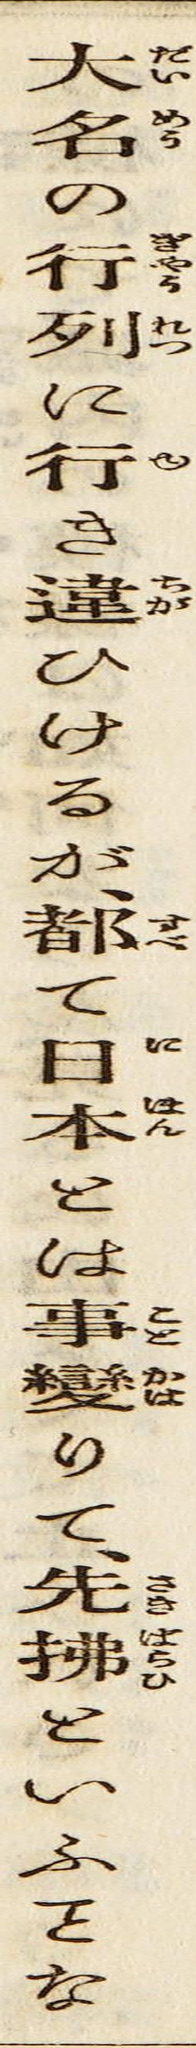大名の行列に行き違ひけるが、都て日本とは事変りて、先払といふことな
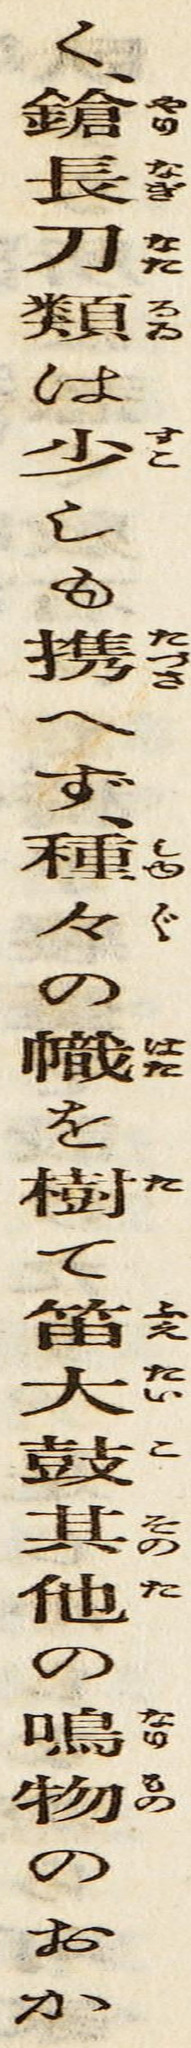く、鎗長刀類は少しも携へず、種々の幟を樹て笛太鼓其他の鳴物のおか
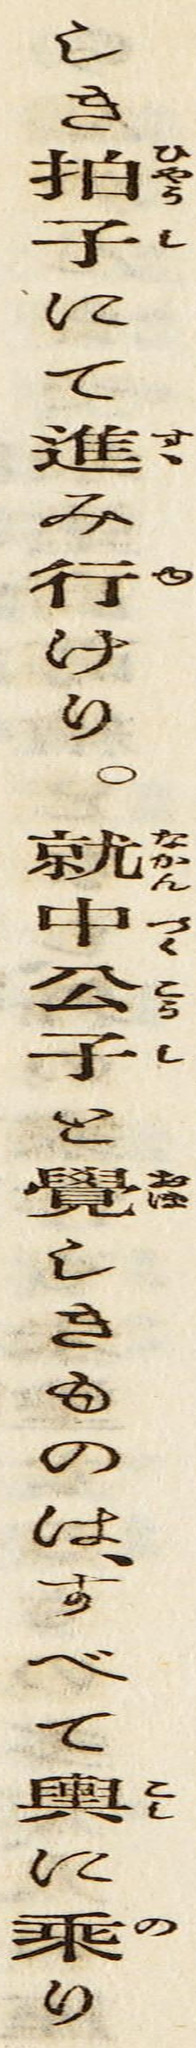しき拍子にて進み行けり。就中公子と覚しきものは、すべて輿に乗り
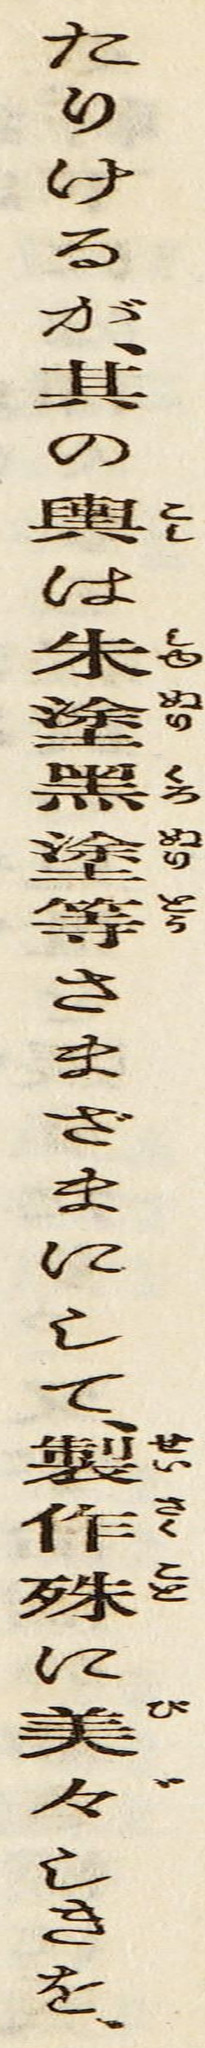たりけるが、其の輿は朱塗黒塗等さまざまにして、製作殊に美々しきを、
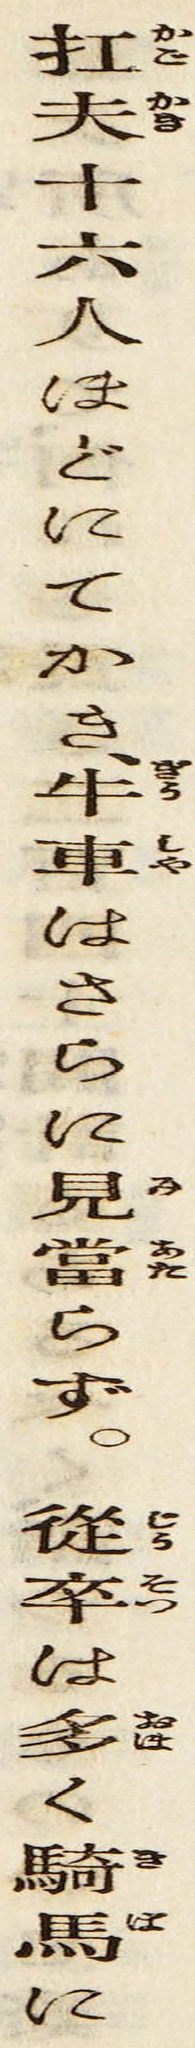扛夫十六人ほどにてかき、牛車はさらに見当らず。従卒は多く騎馬に
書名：日本漂流譚
